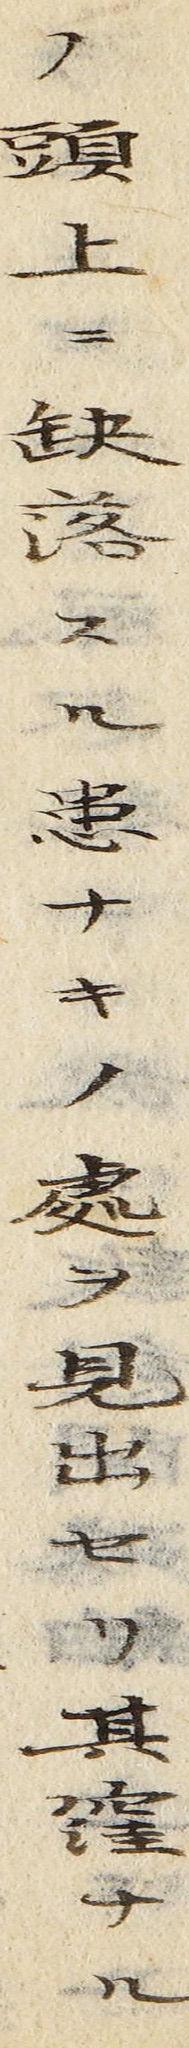ノ頭上ニ欠落スル患ナキノ処ヲ見出セリ其窪ナル
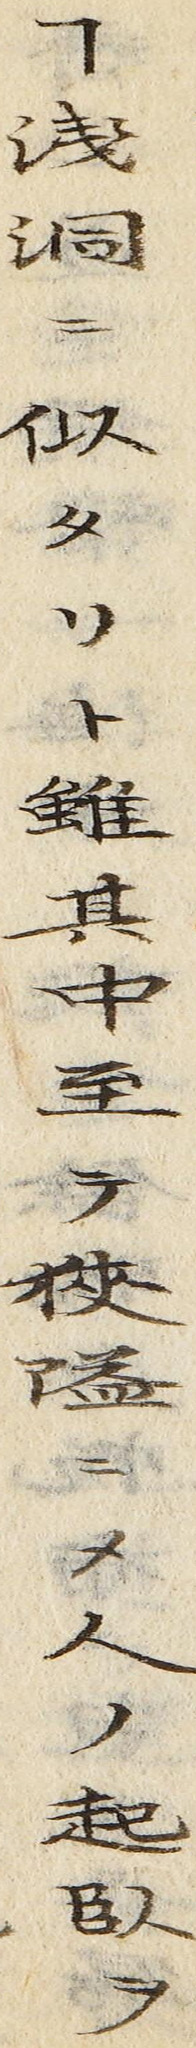コト浅洞ニ似タリト雖其中至テ狭隘ニシテ人ノ起臥ヲ
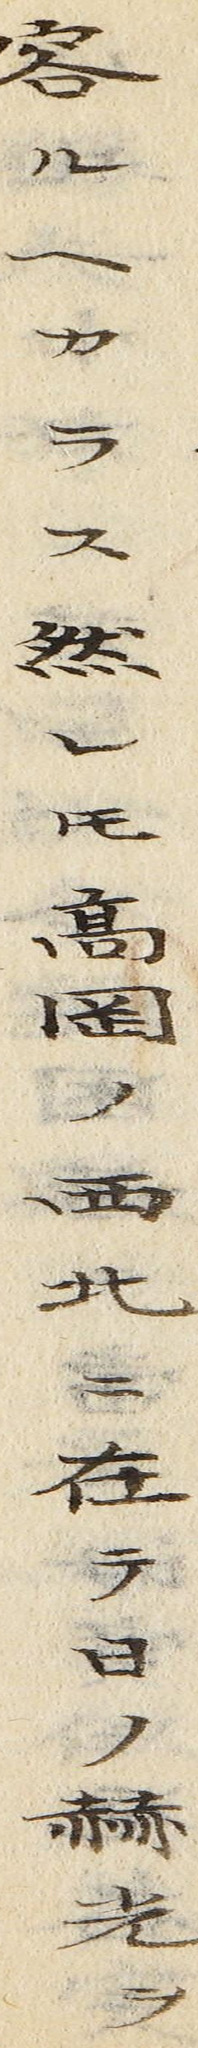容ルヘカラス然レトモ高岡ノ西北ニ在テ日ノ赫光ヲ
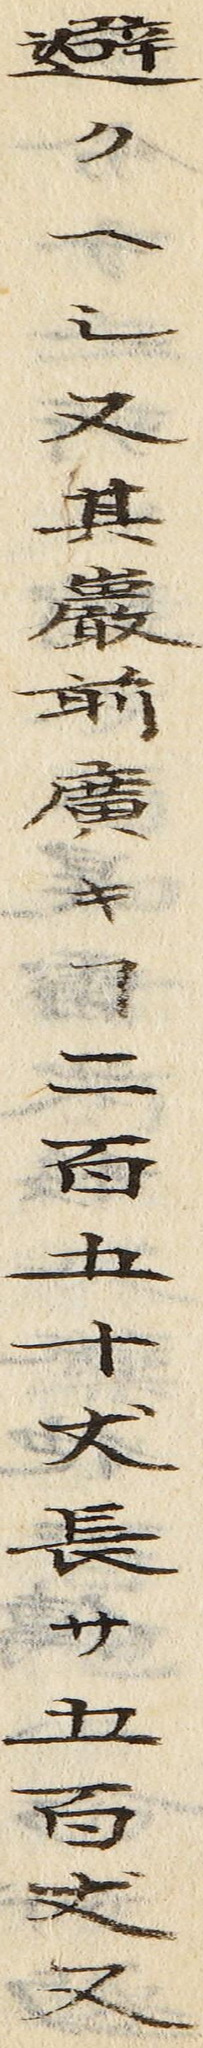避クヘシ又其巌前広キコト二百五十丈長サ五百丈又
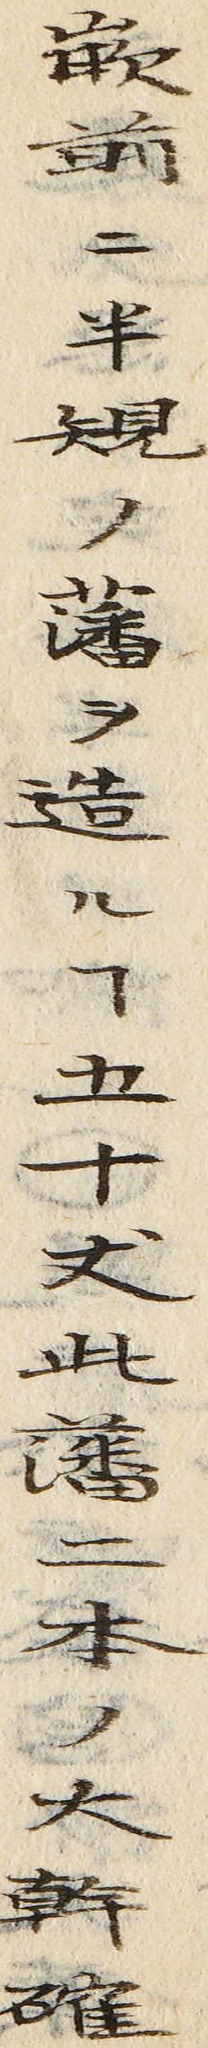嵌前ニ半規ノ藩ヲ造ルコト五十丈此藩二本ノ大幹確
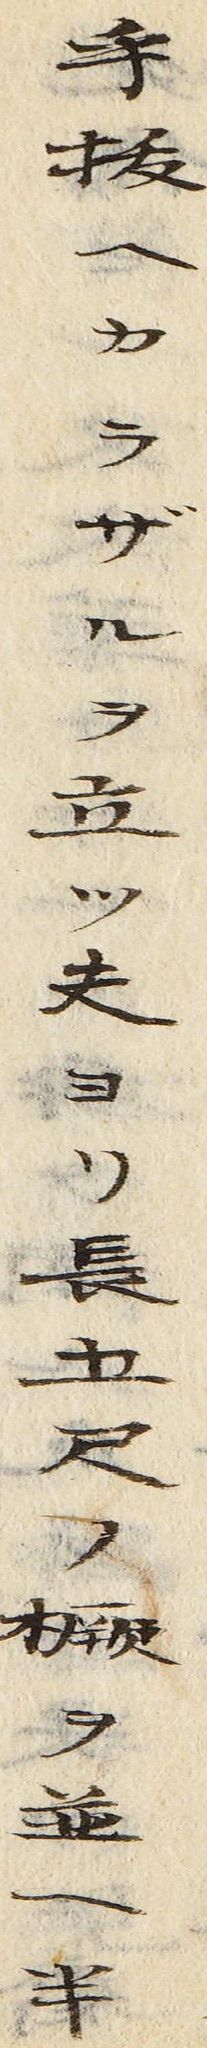乎抜ヘカラザルヲ立ツ夫ヨリ長五尺ノ橛ヲ並ヘ半
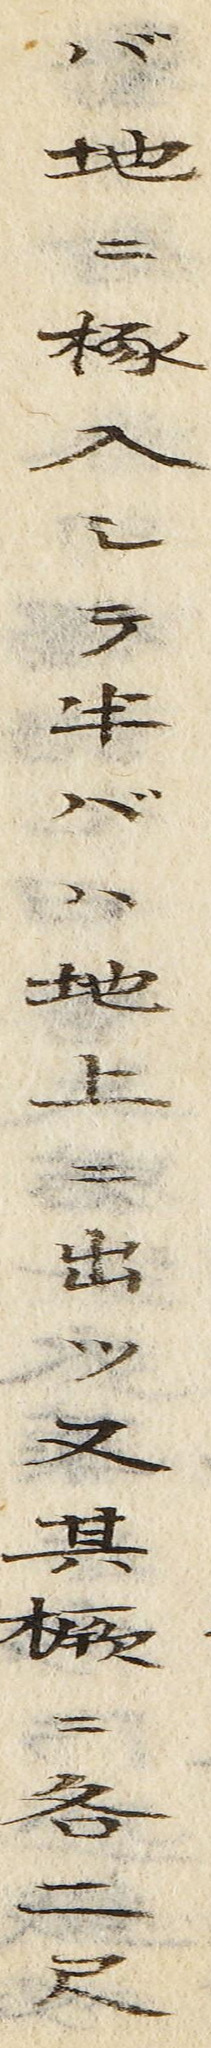バ地ニ椓入シテ半バハ地上ニ出ツ又其橛ニ各二尺
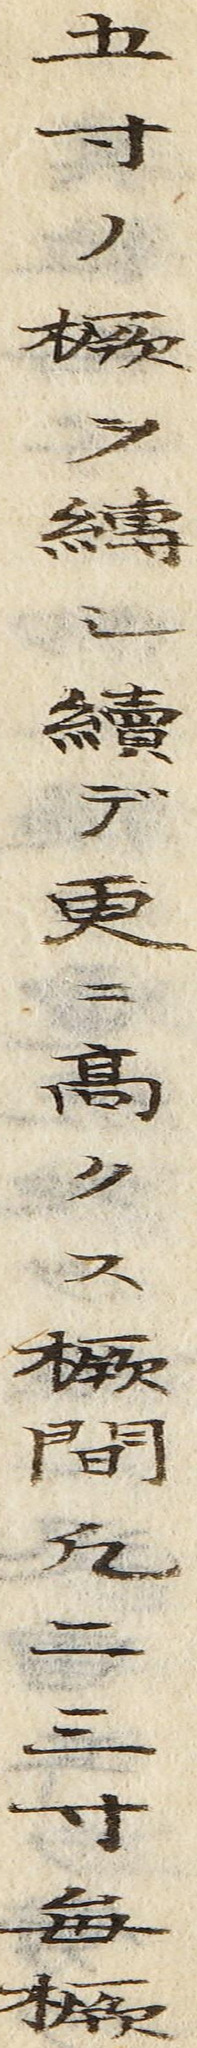五寸ノ橛ヲ縛シ続デ更ニ高クス橛間凡二三寸毎橛
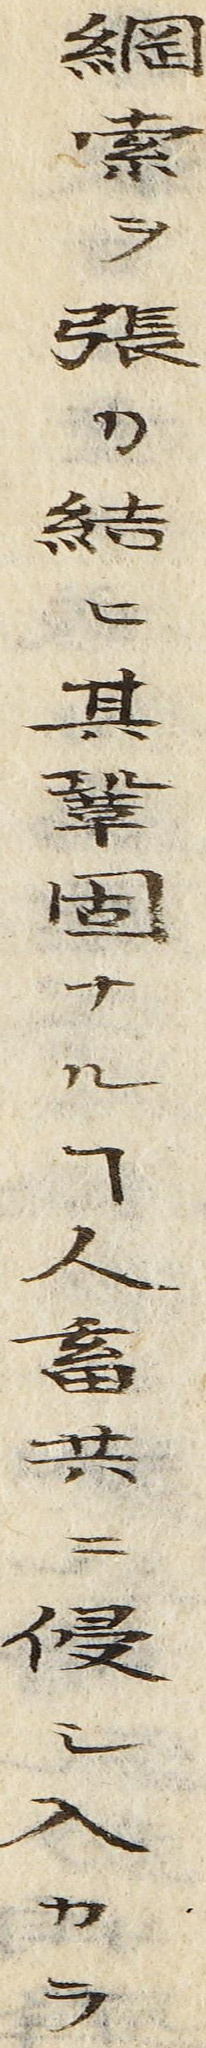綱索ヲ張リ結ヒ其鞏固ナルコト人畜共ニ侵シ入カラ
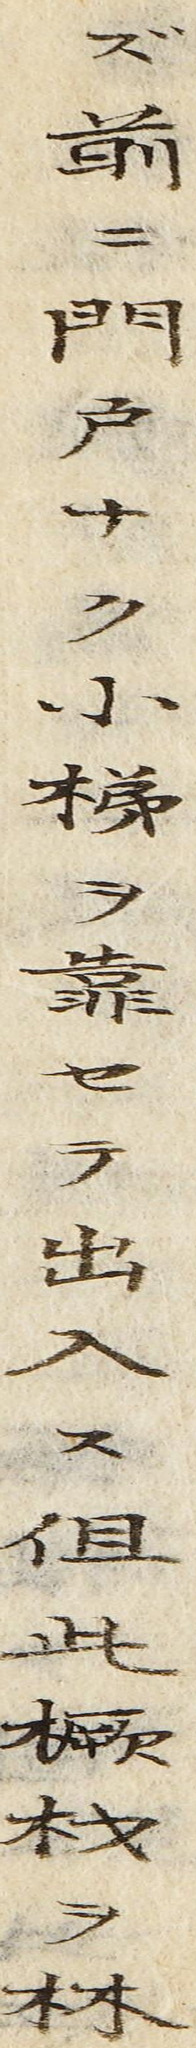ズ前ニ門戸ナク小梯ヲ靠セテ出入ス伹此橛材ヲ林
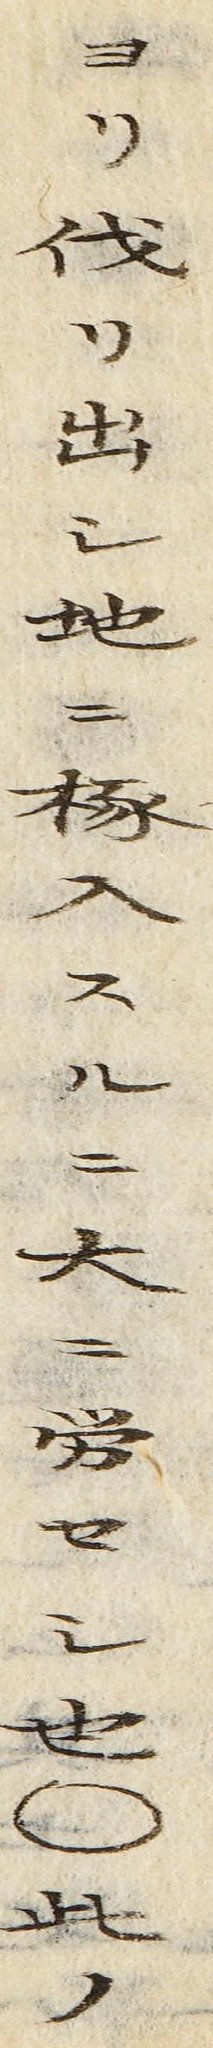ヨリ伐リ出シ地ニ椓入スルニ大ニ労セシ也◯此ノ
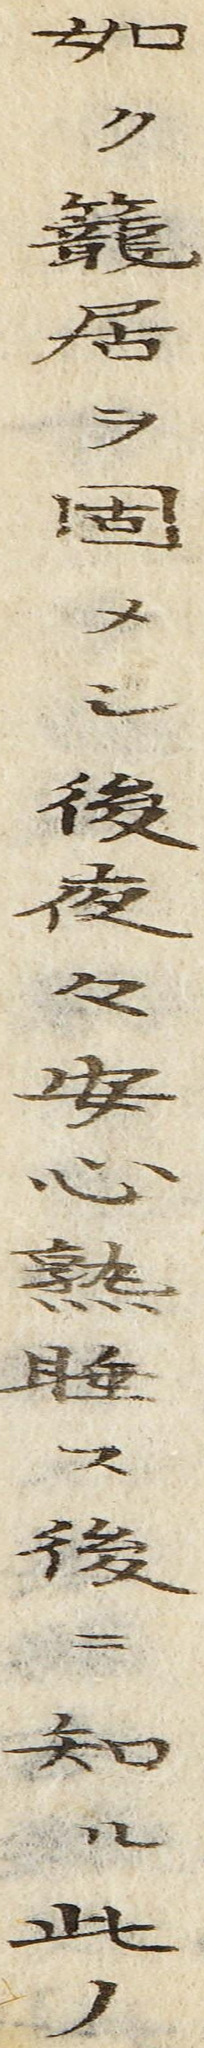如ク籠居ヲ固メシ後夜々安心熟睡ス後ニ知ル此ノ
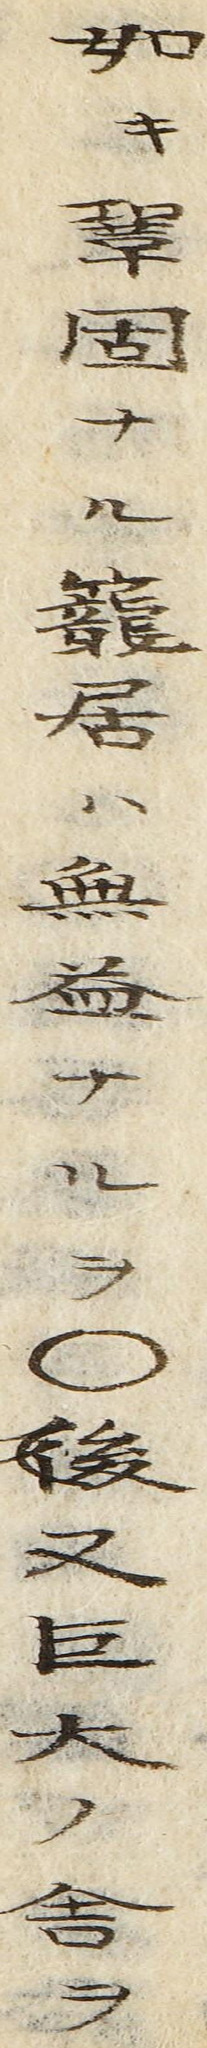如キ鞏固ナル籠居ハ無益ナルヲ◯後又巨大ノ舎ヲ
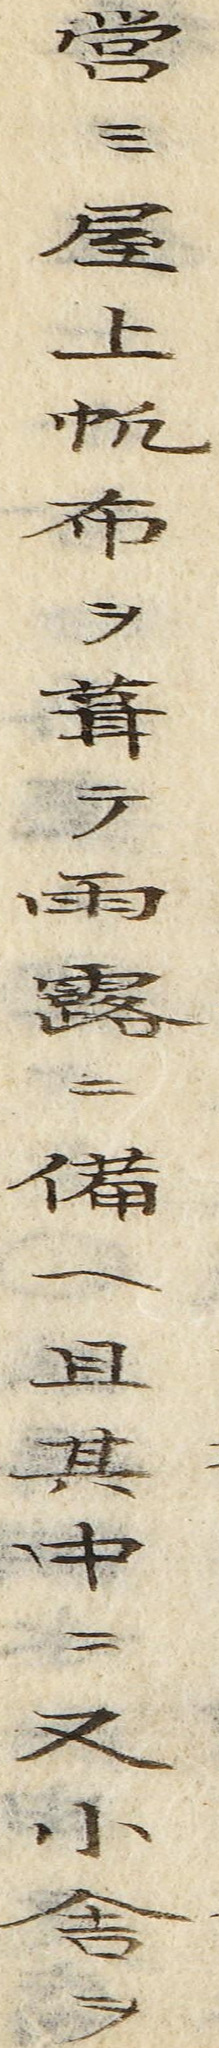営ミ屋上帆布ヲ葺テ雨露ニ備ヘ且其中ニ又小舎ヲ

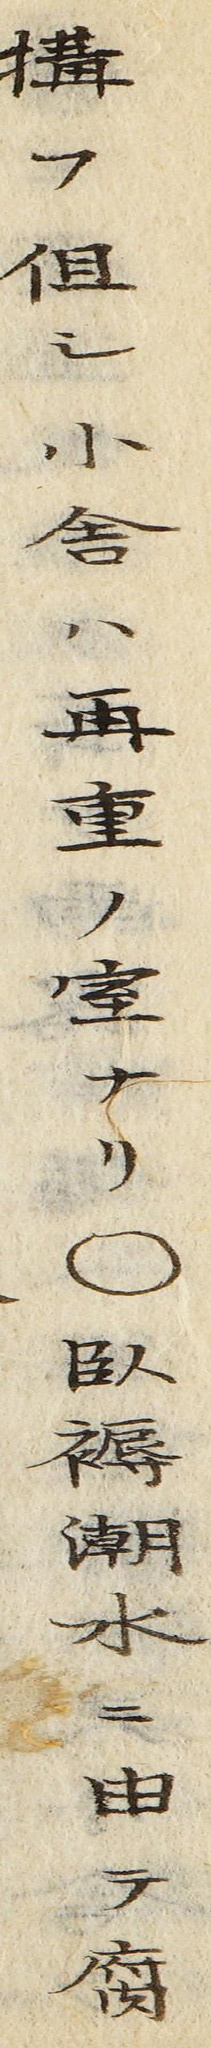構フ伹シ小舎ハ再重ノ室ナリ◯臥褥潮水ニ由テ腐
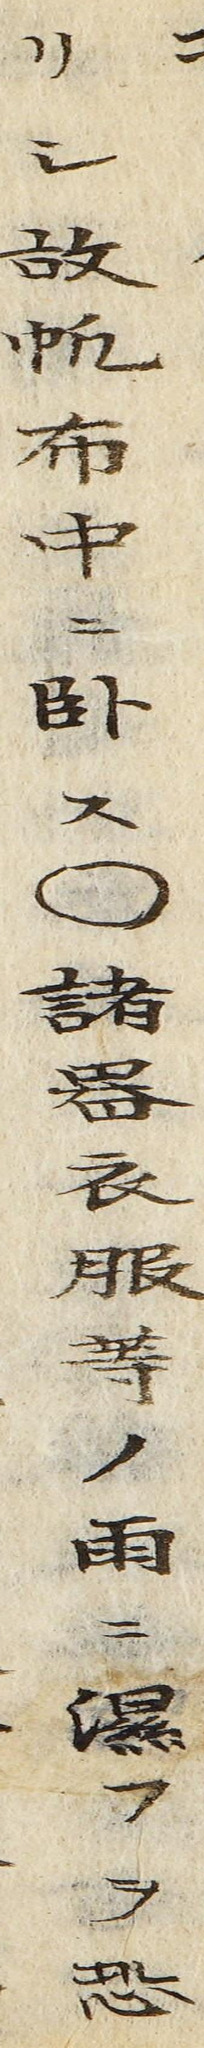リシ故帆布中ニ臥ス◯諸器衣服等ノ雨ニ湿フヲ恐
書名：漂流紀事
